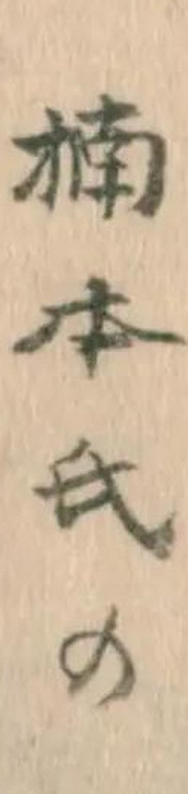楠本氏の
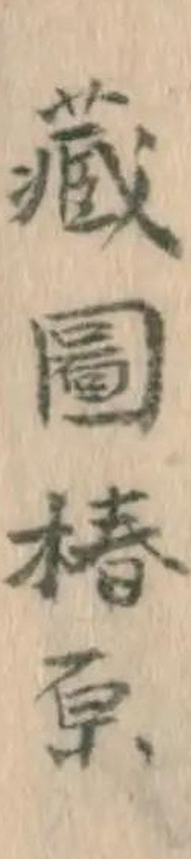蔵図椿原
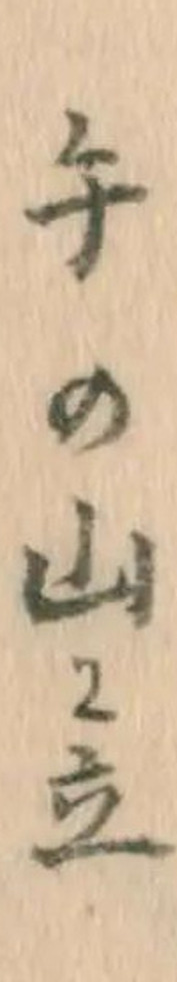手の山に立
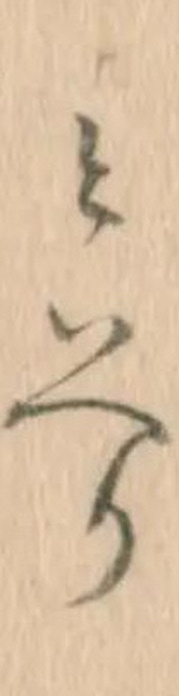といへり
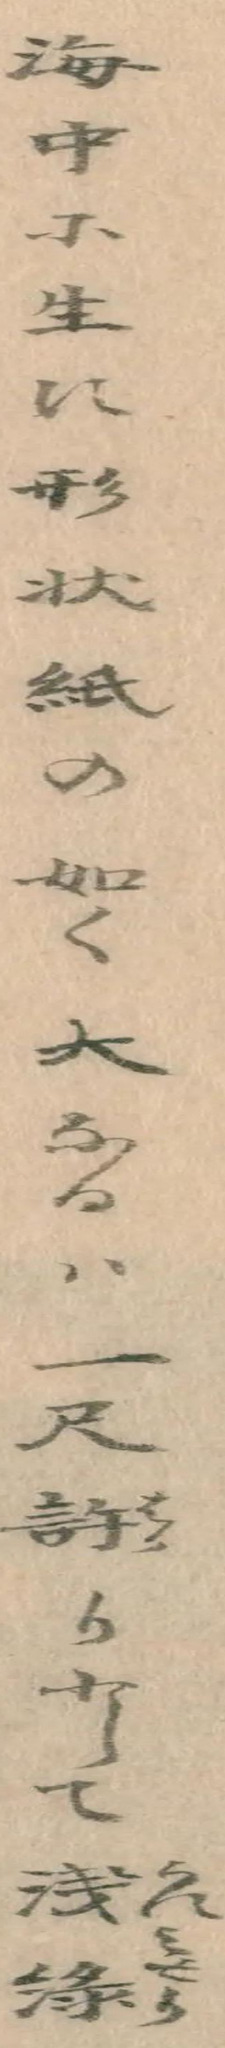海中に生す形状紙の如く大なるは一尺許りにして浅緑
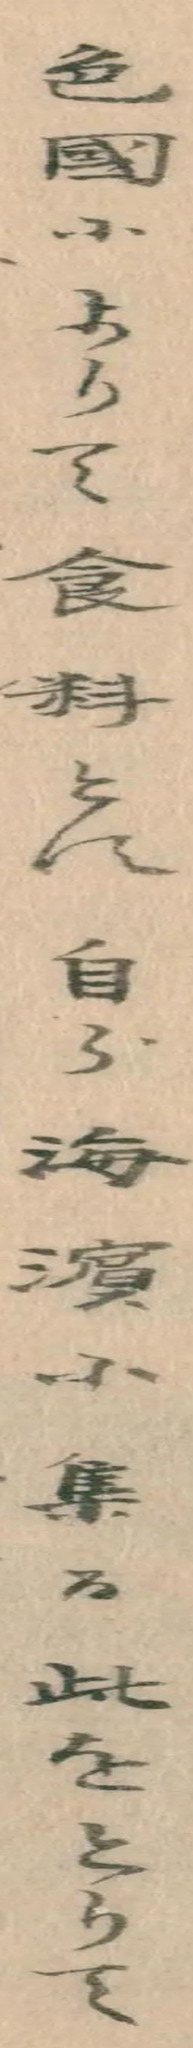色国によりて食料とす自ら海浜に集る此をとりて
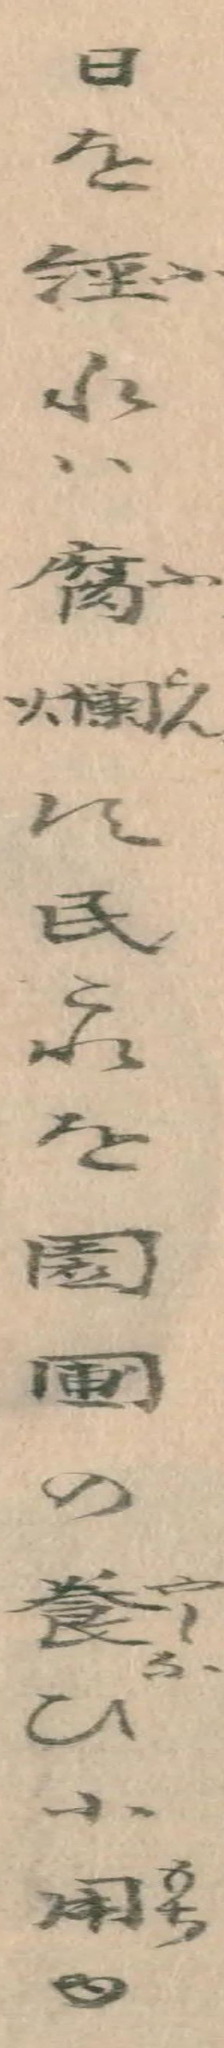日を経れは腐爛す民これを園圃の養ひに用ゆ

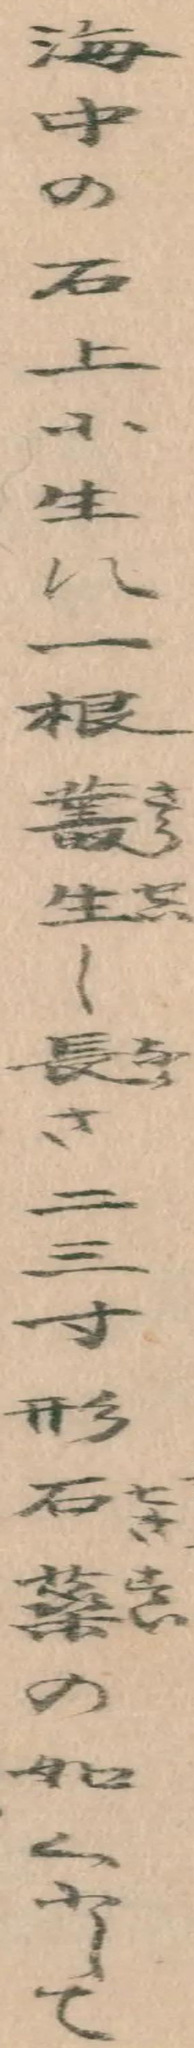海中の石上に生す一根叢生し長さ二三寸形石蕊の如くにして
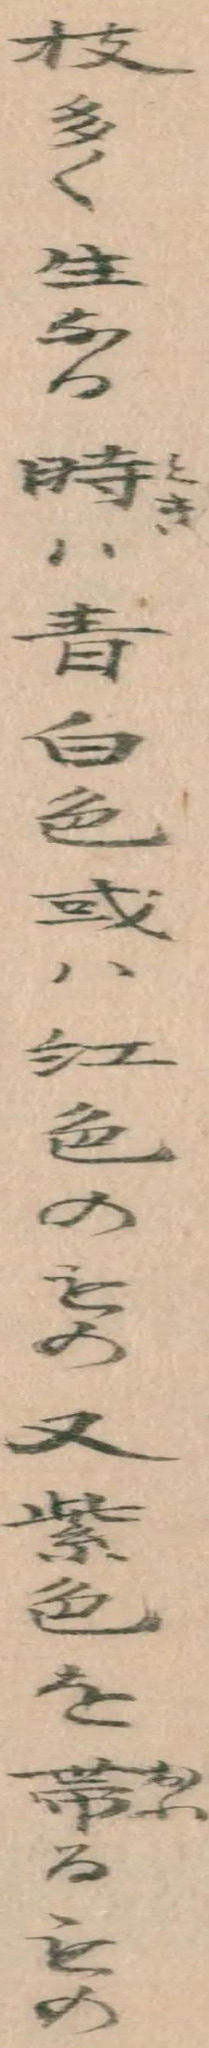枝多く生なる時は青白色或は紅色のもの又紫色を帯るもの
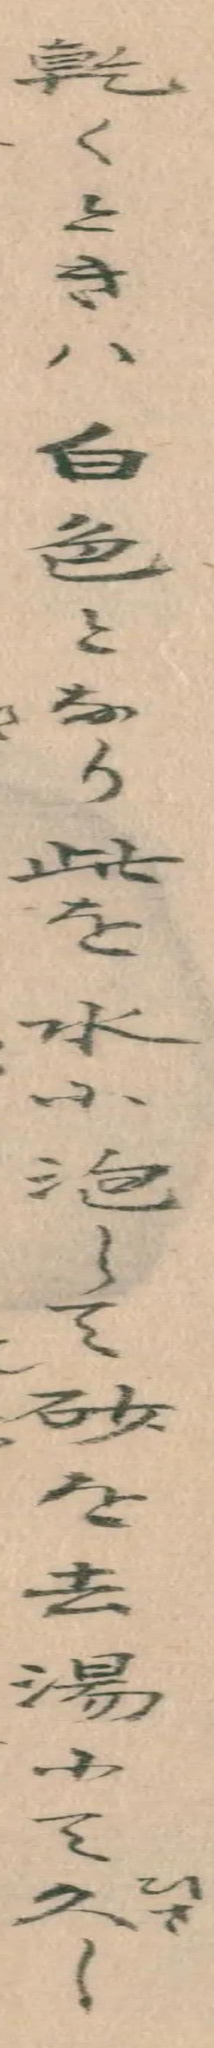乾くときは白色となり此を水に泡して砂を去湯にて久し
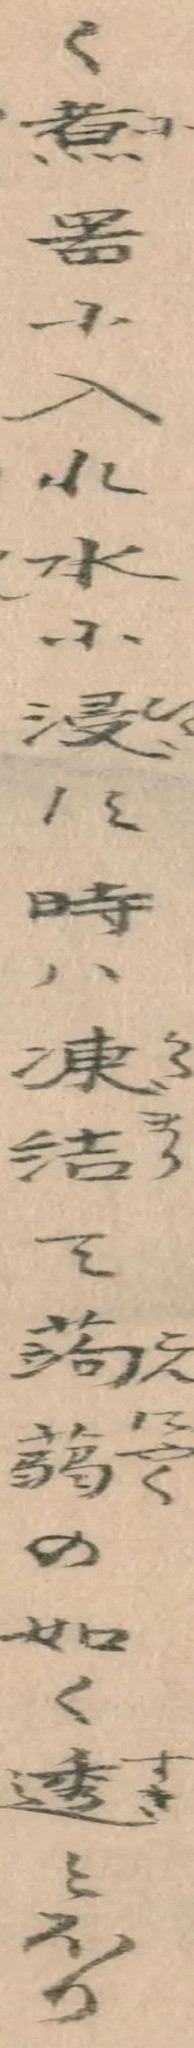く煮器に入れ水に浸す時は凍結て蒟蒻の如く透とほり
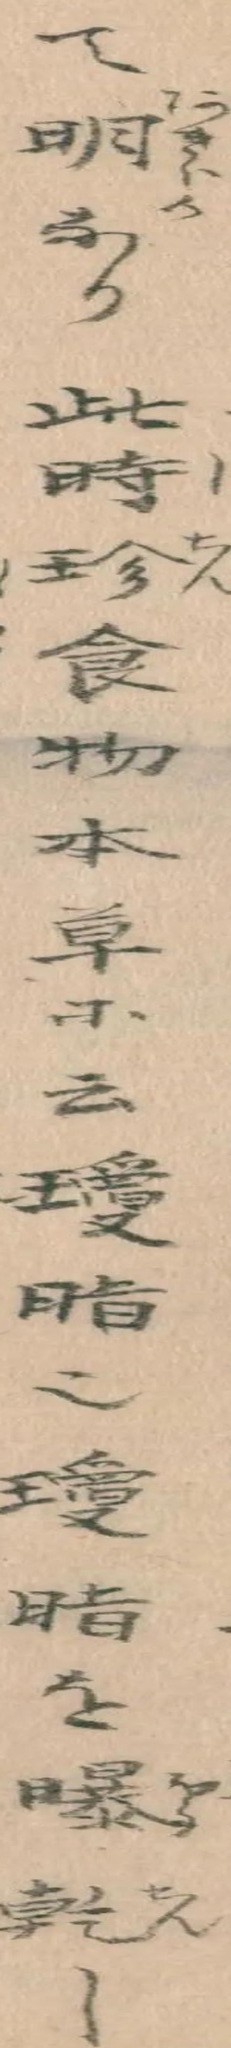て明なり此時珍食物本草に云瓊脂也瓊脂を曝乾し
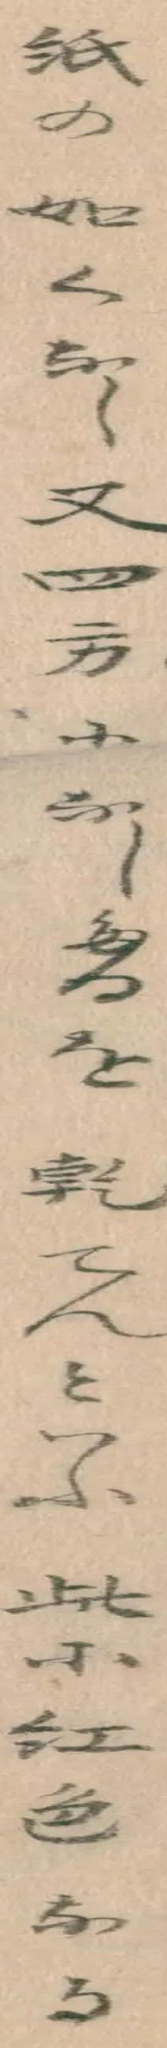紙の如くなし又四方になしたるを乾てんといふ此に紅色なる
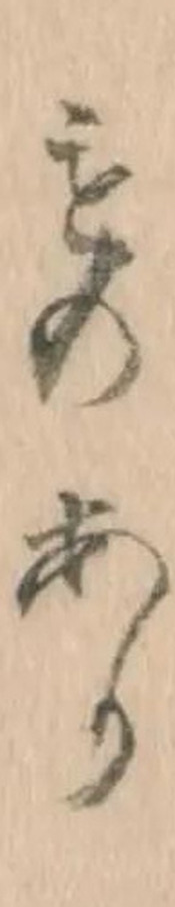ものあり
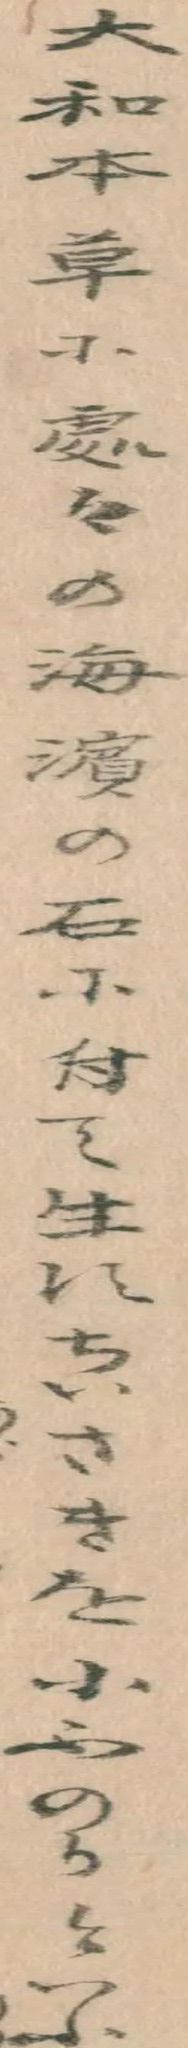大和本草に処々の海浜の石に付て生すちいさきを小ふのりといふ
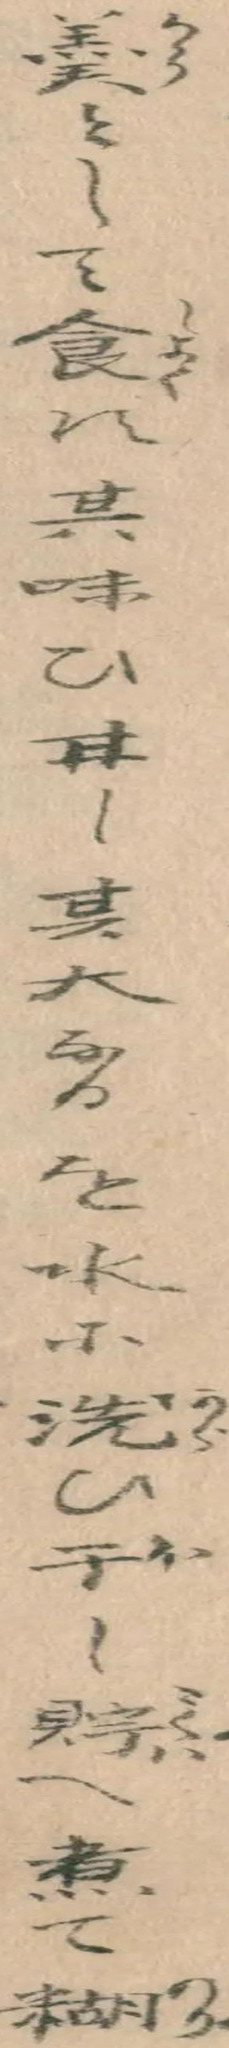羹として食す其味ひ甘し其大なるを水に洗ひ干し貯へ煮て糊
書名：本草図譜. 巻52-54
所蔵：国立国会図書館 National Diet Library, JAPAN
